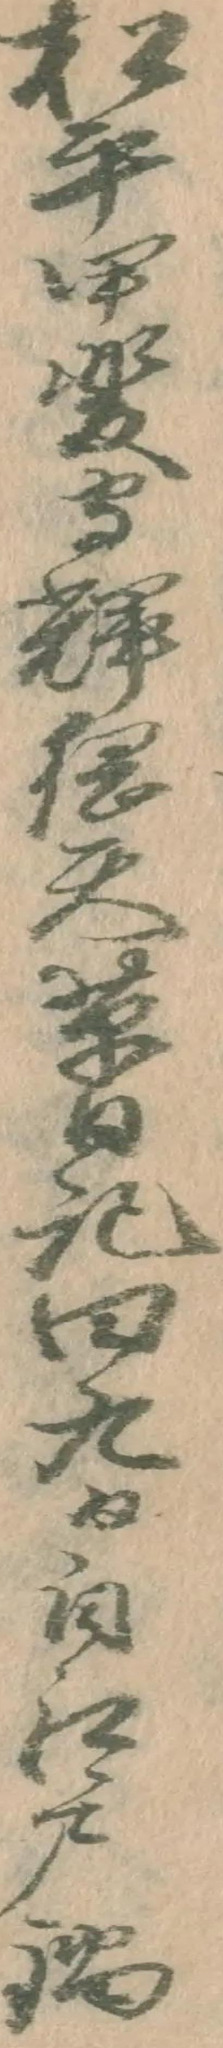松平甲斐守輝綱天草日記曰九日自江戸鍋
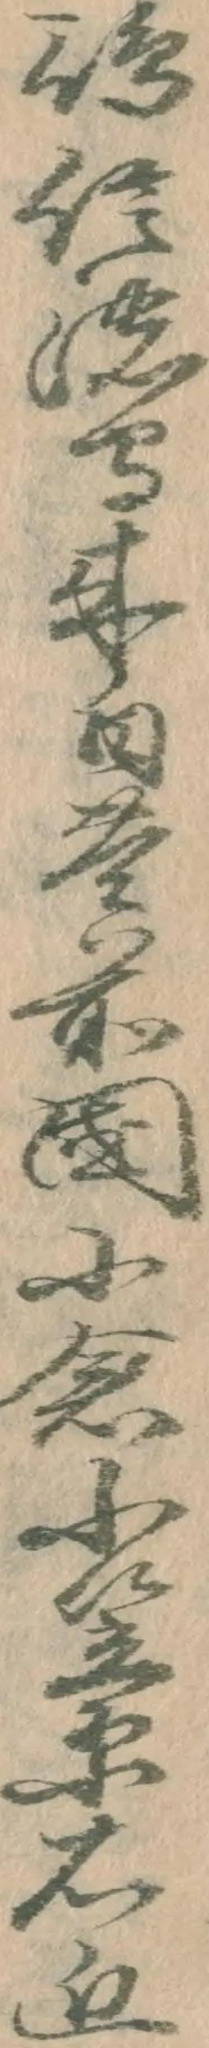島信濃守来自豊前国小倉小笠原右近
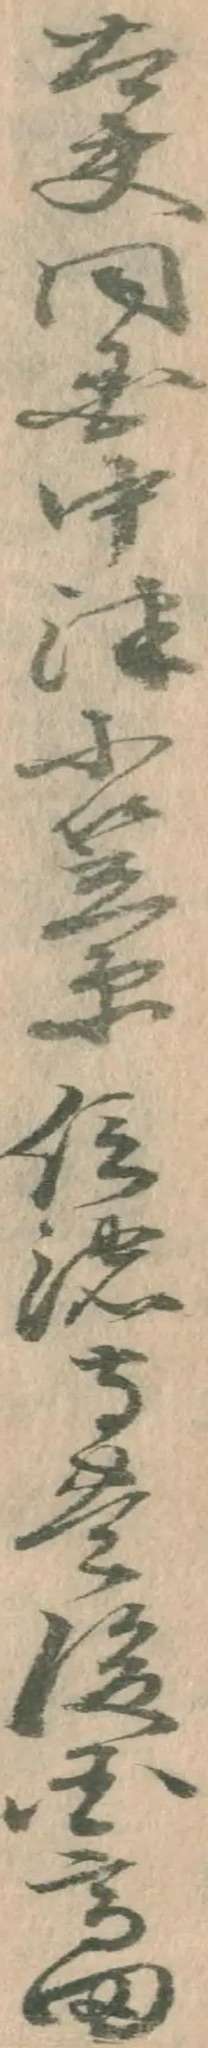太夫同国中津小笠原信濃守豊後国高田
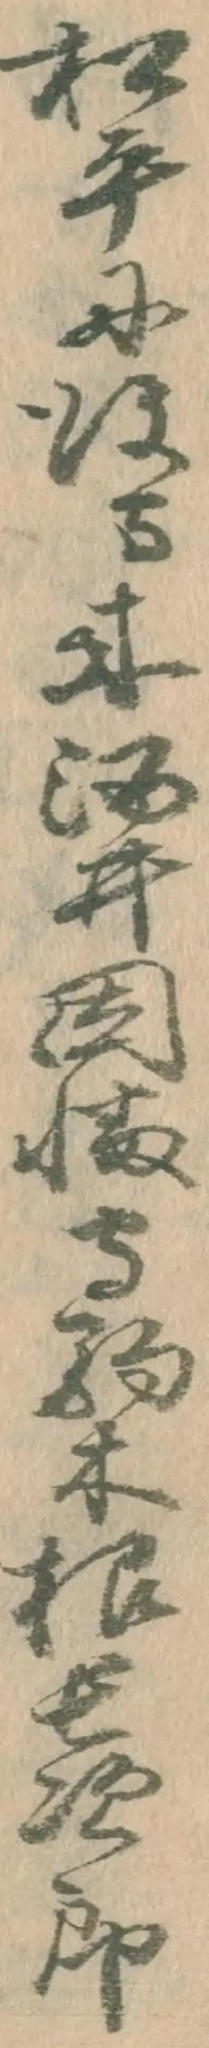松平丹後守来酒井因幡守駒木根長次郎

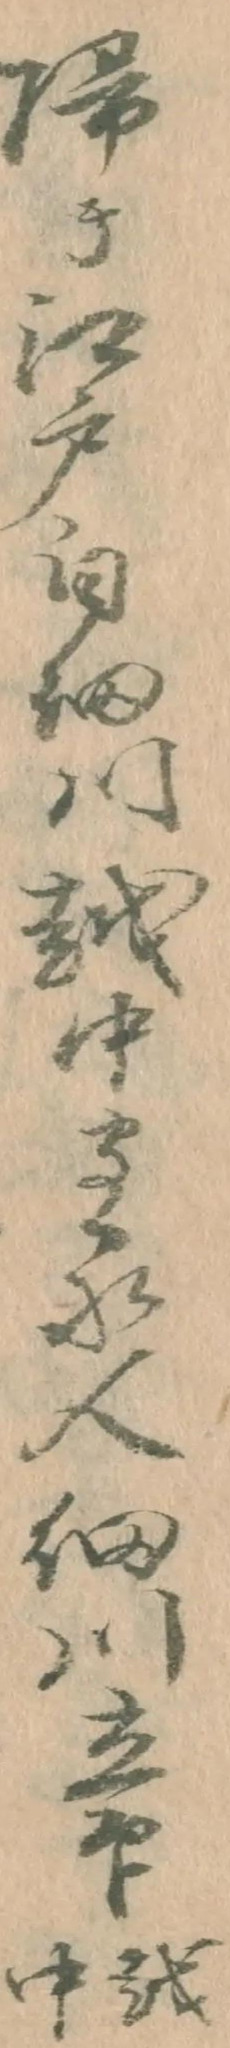帰干江戸自細川越中守家人細川立印越中
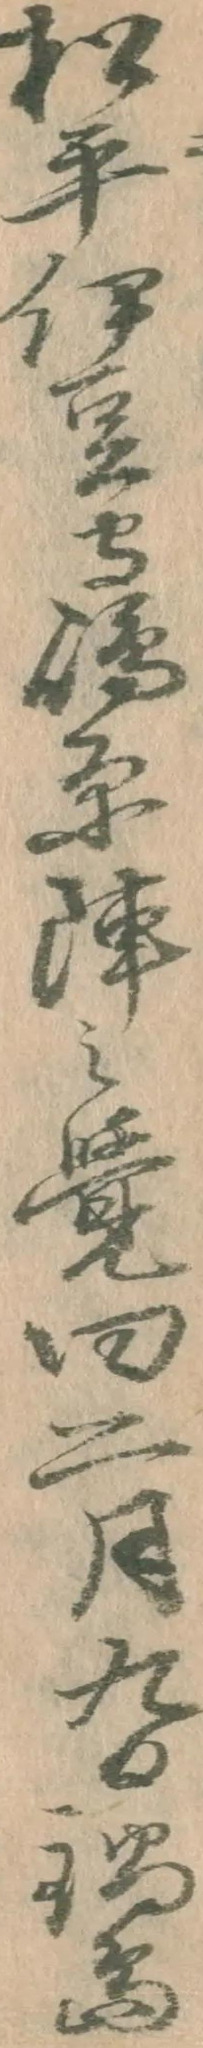松平伊豆守島原陣之覚曰二月九日鍋島
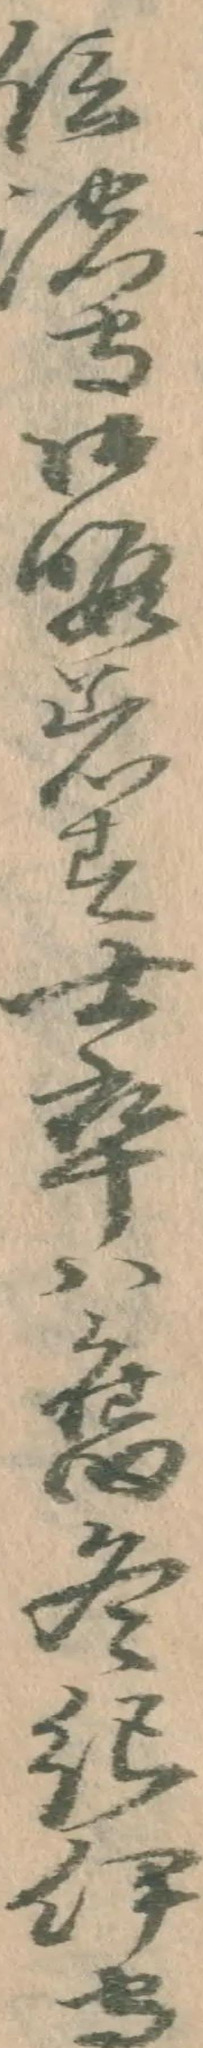信濃守御暇着春士卒は旧冬紀伊守
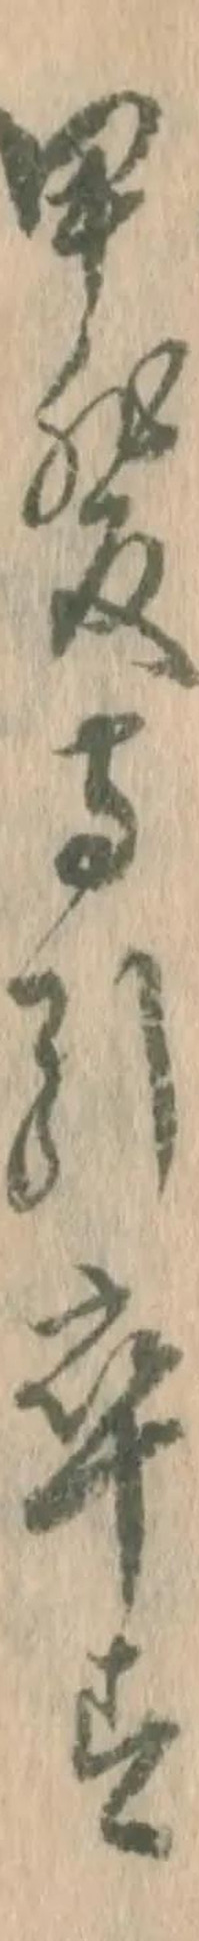甲斐守引卒春
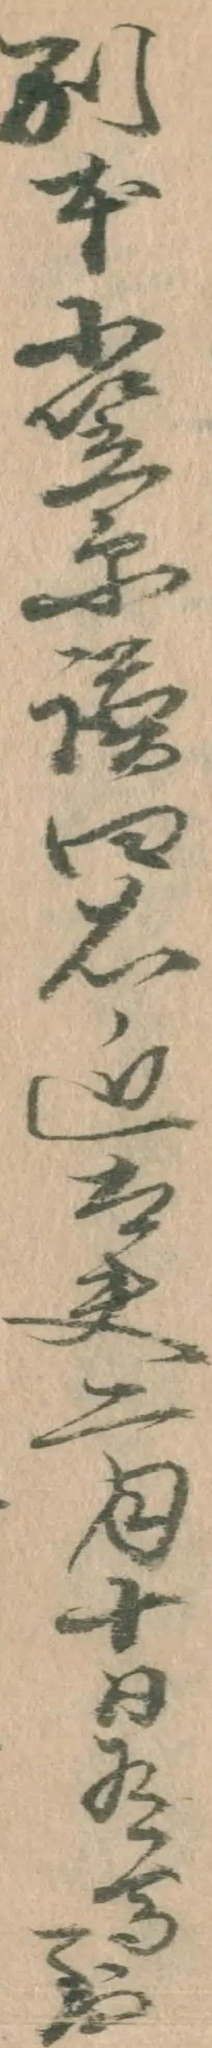別本小笠原譜曰右近太夫二月十日有馬参
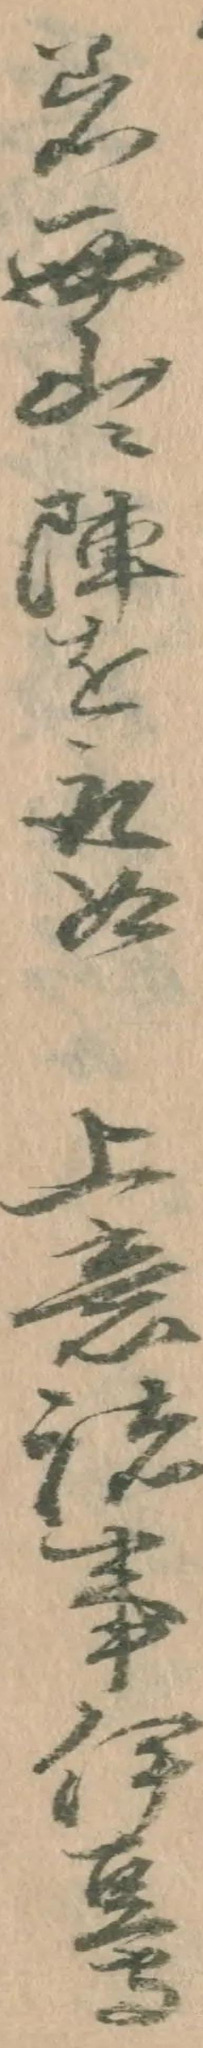着西山に陣を取ぬ上意諸事伊豆守
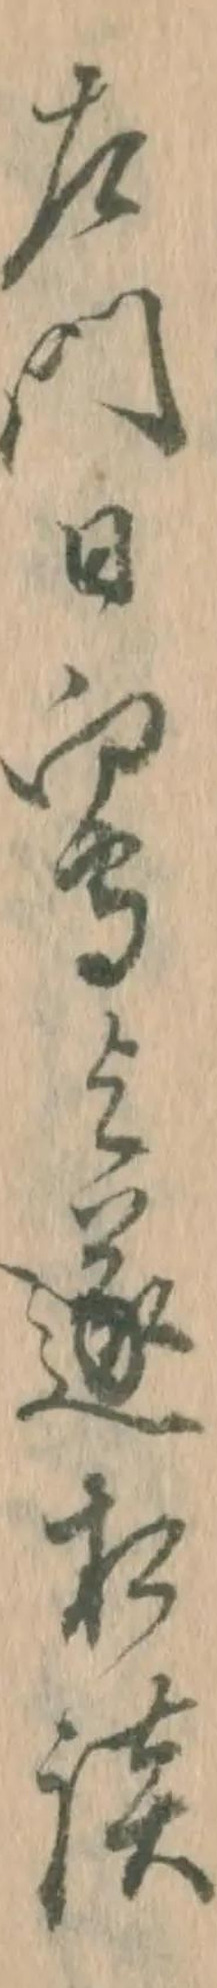左門日向守与遂相談
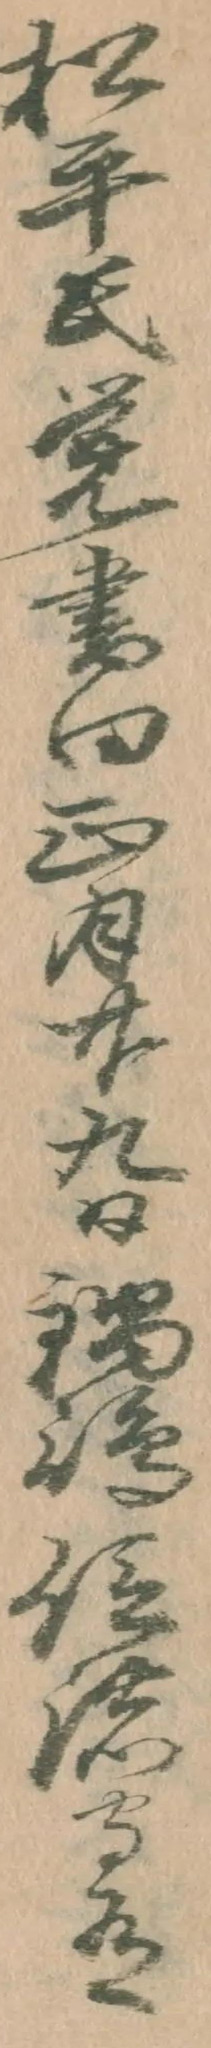松平氏覚書曰正月廿九日鍋島信濃守有
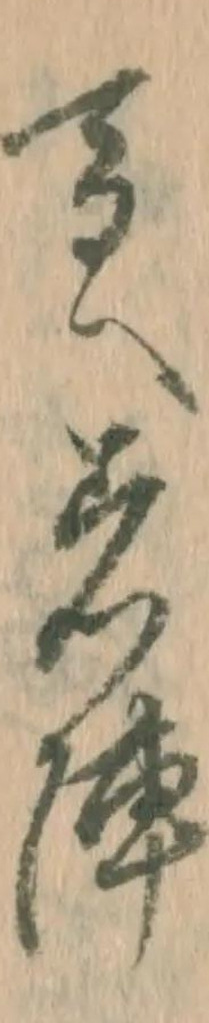馬へ着陣
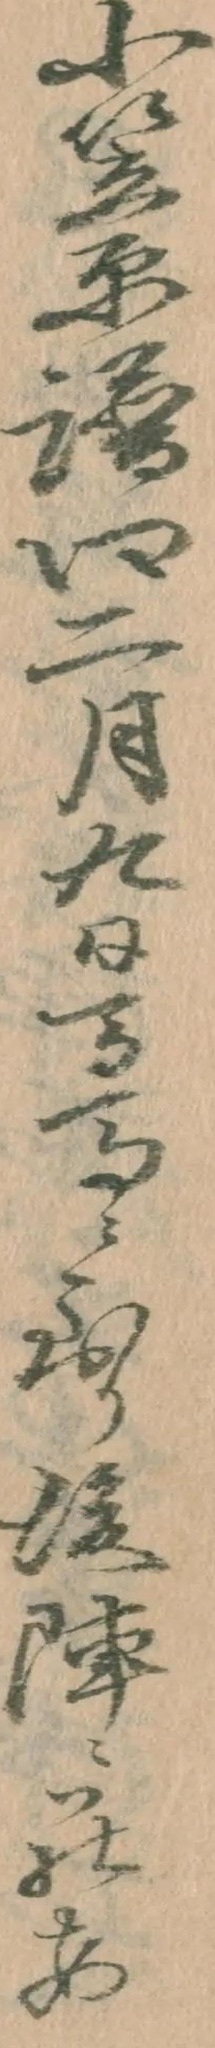小笠原譜曰二月九日馬馬に至り後陣に罷あ
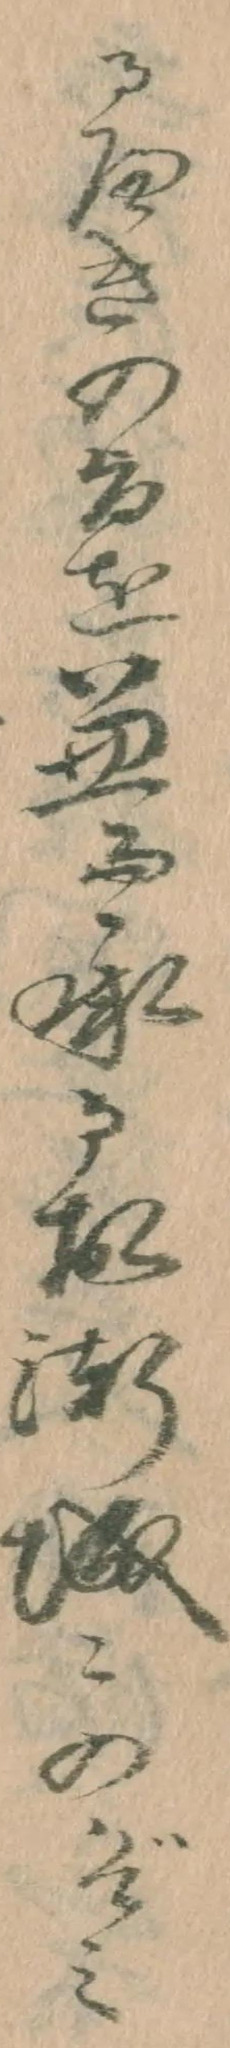る扁きの旨を兼而承る故漸城にのぞみ
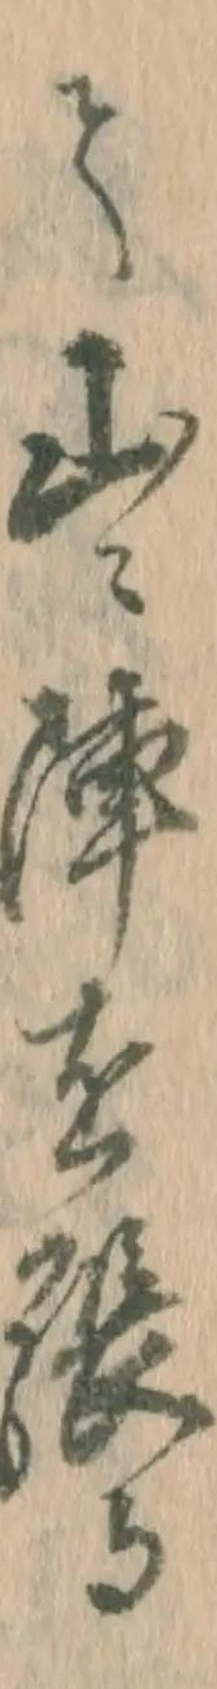て山に陣を張る
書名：切支丹御退治記 49巻. [6]
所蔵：国立国会図書館 National Diet Library, JAPAN
